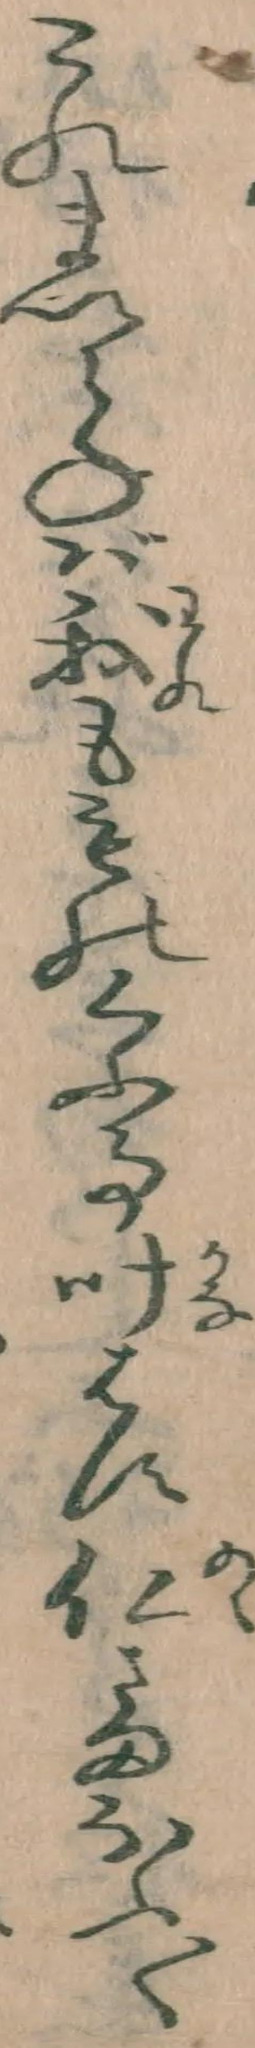これまいらねば我もものくふ事叶はず仏さまなふ〳〵
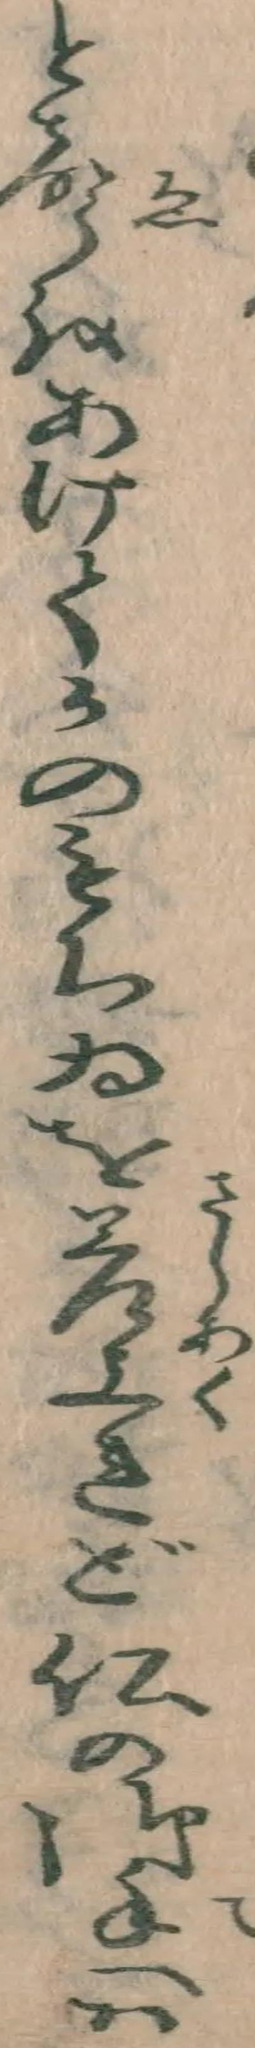と声をあけてかのもちゐを差上れど仏の御手へは
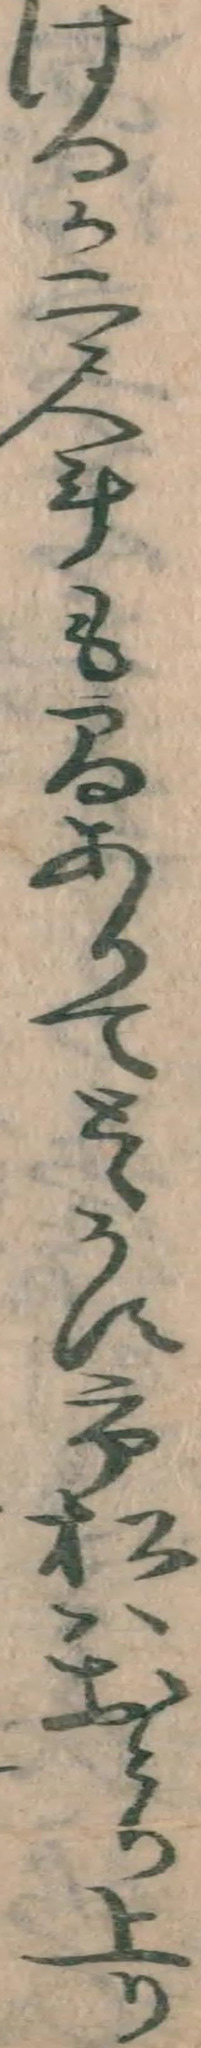はるか二尺斗も間ありてとゝかす市松はおとり上り
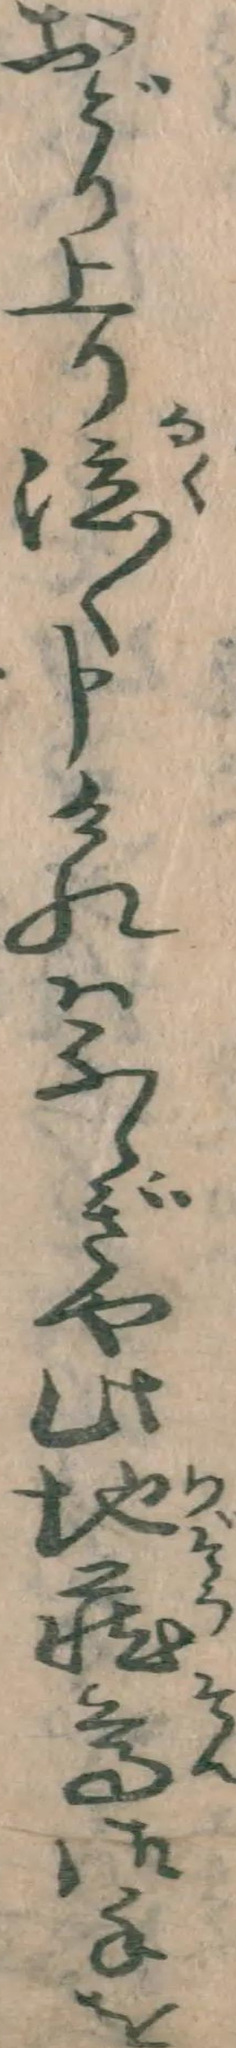おどり上り泣〳〵申けれはふしぎや此地蔵尊御手を
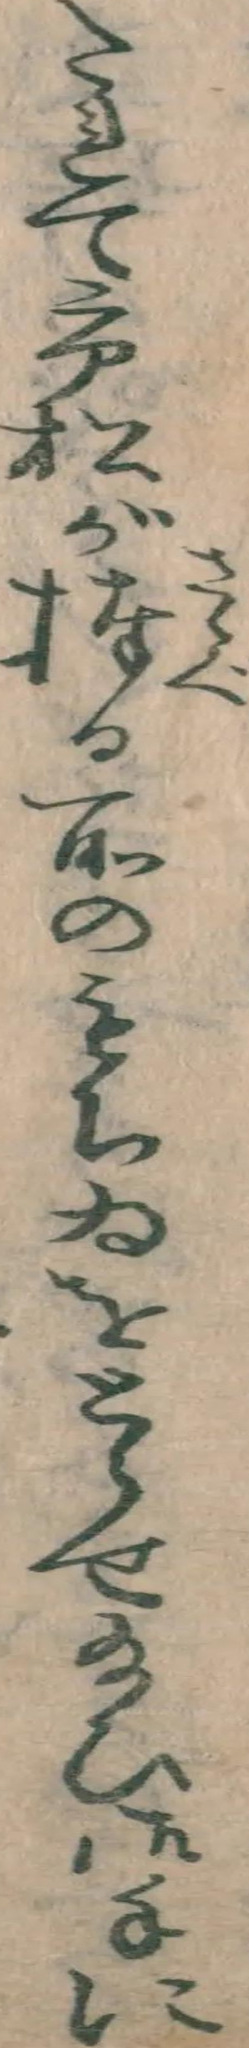たれて市松が捧る所のもちゐをとらせ給ひ御手に
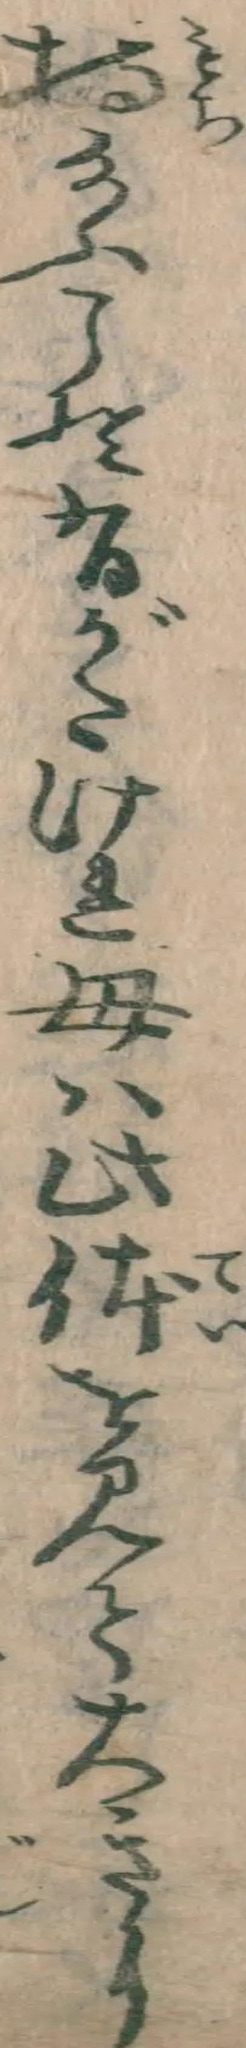持給ふこそ有がたけれ母は此体を見て大きに
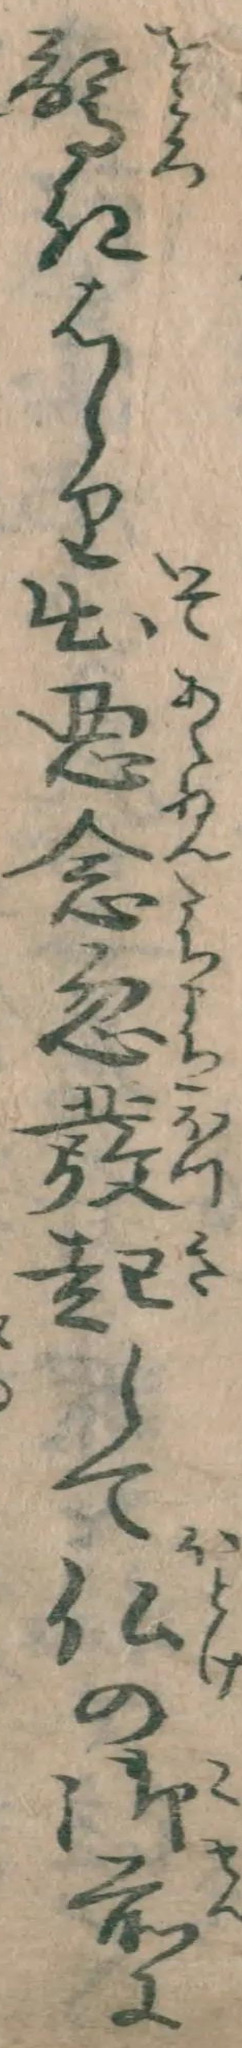驚きはしり出悪念忽発起して仏の御前に
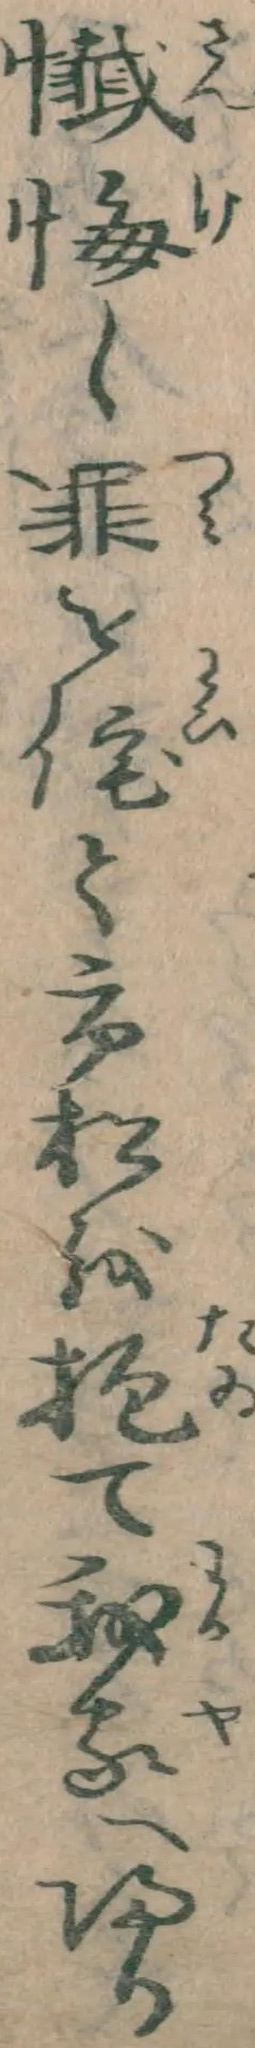懺悔し罪を詫て市松を抱て我家へ帰り

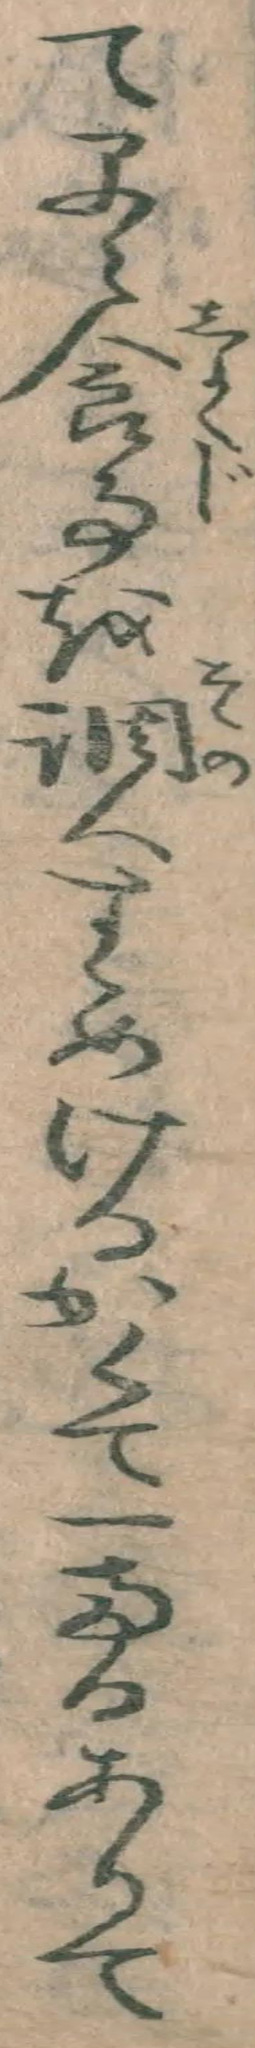て早々食事を調へすゝめけるかくて一両日ありて
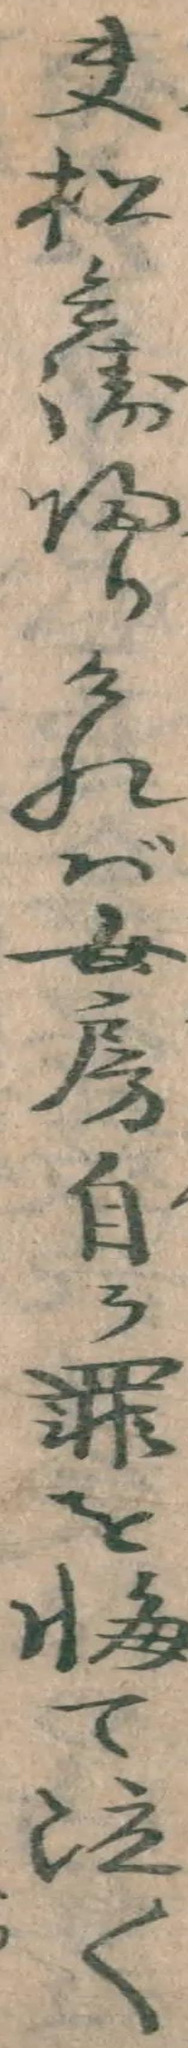夫松兵衛帰りければ女房自ら罪を悔て泣〳〵
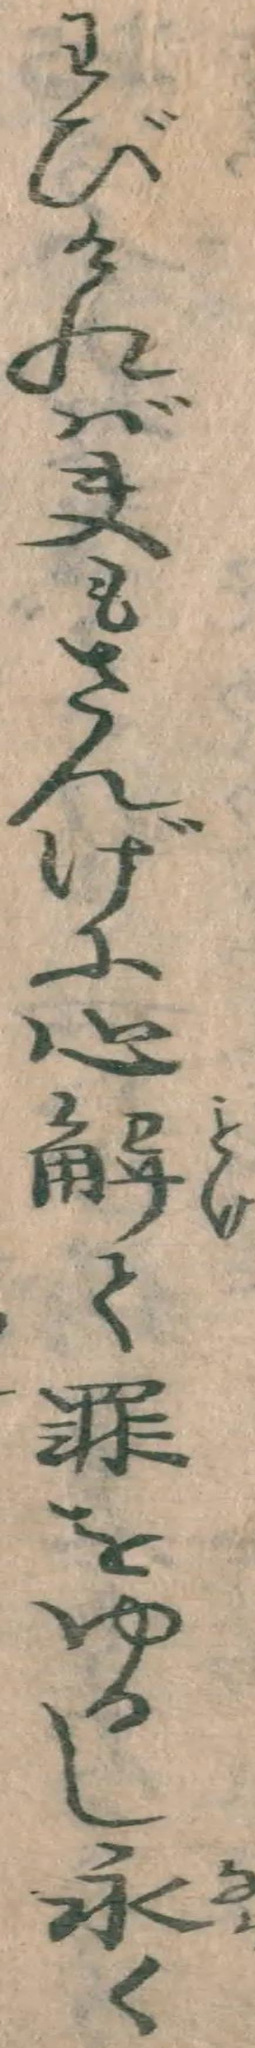わびければ夫もさんげに心解て罪をゆるし永く
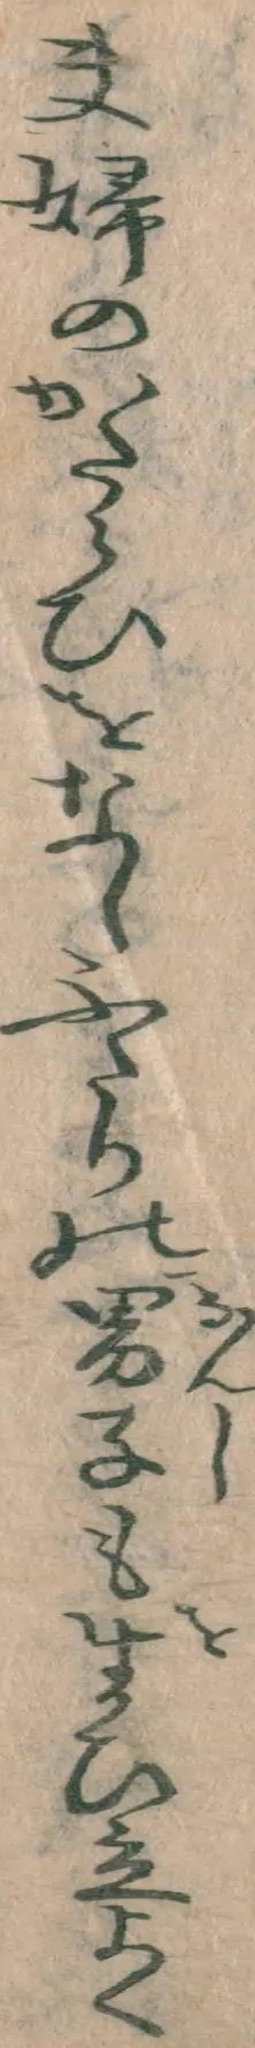夫婦のかたらひをなしふたりの男子も生ひ立よく
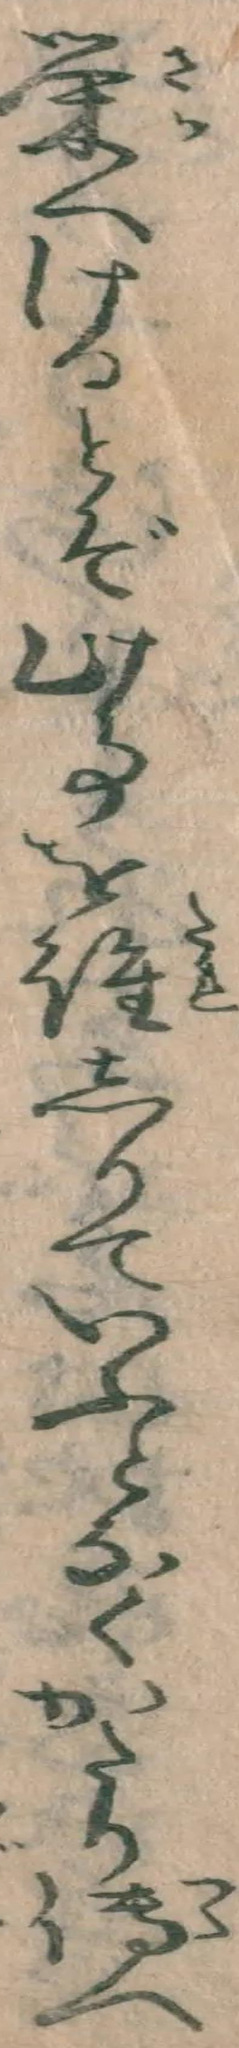栄へけるとぞ此事を誰しりていふとなくかたり伝へ
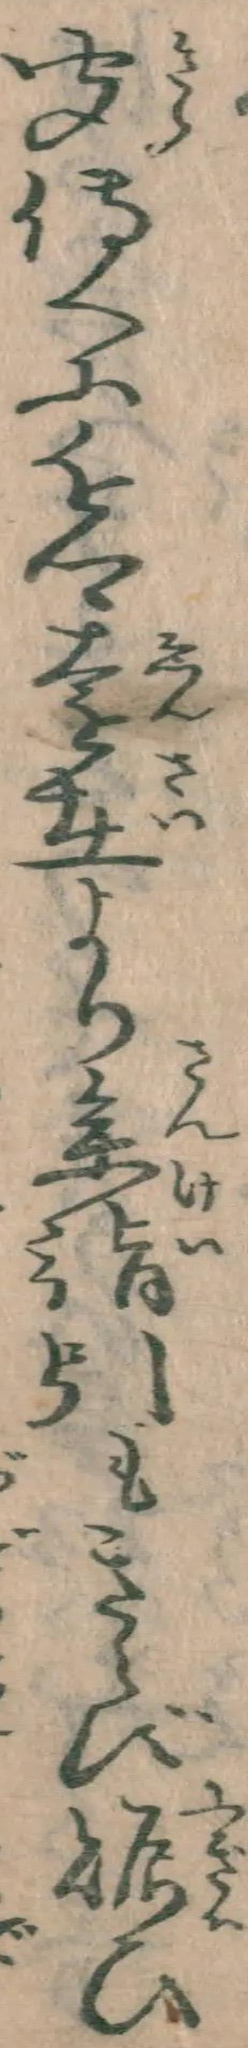聞傳へに近郷遠在より参詣引もきらず賑ひ
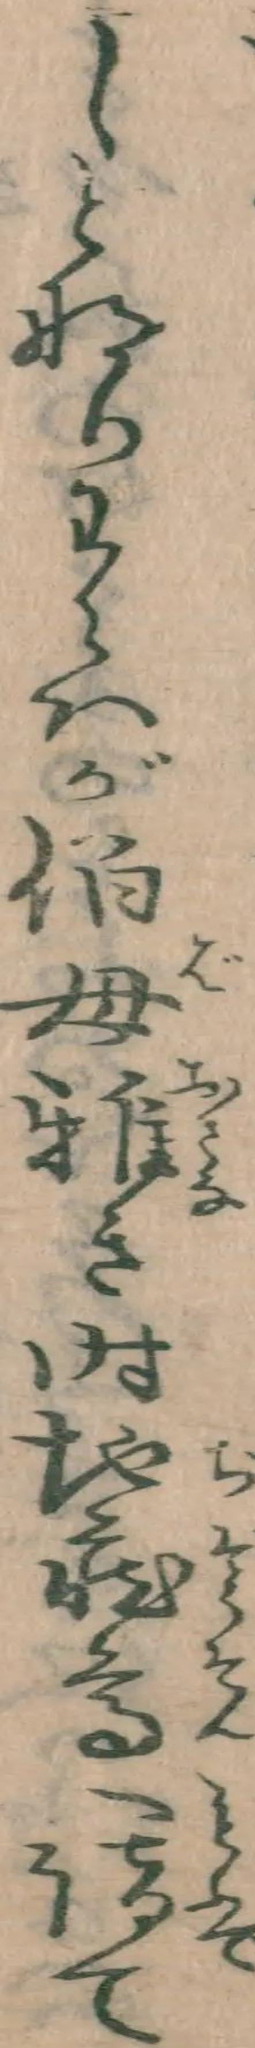しとなりわらはが伯母稚き時地蔵尊へ詣て
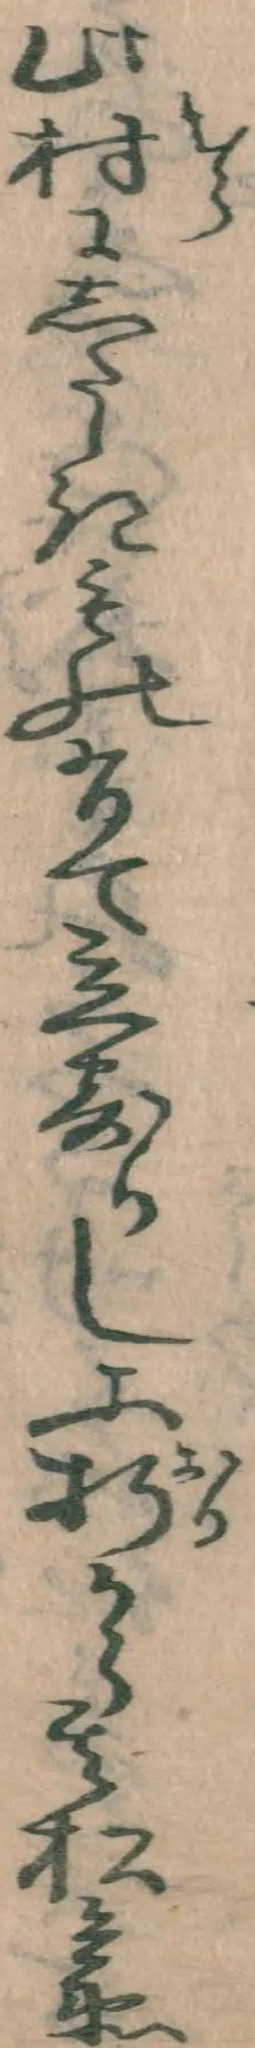此村にしたしきもの有て立寄りしに折から其松兵衛
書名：怪談御伽童 5巻. [1]
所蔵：国立国会図書館 National Diet Library, JAPAN
